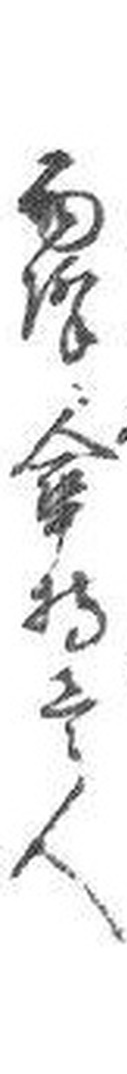雨降ニ傘持壱人
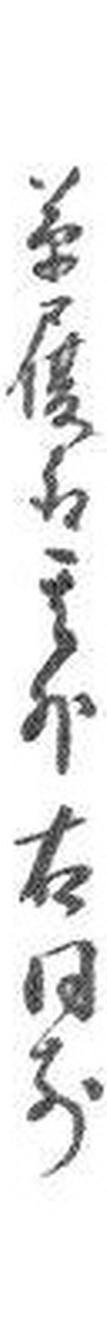草履取其外右同前
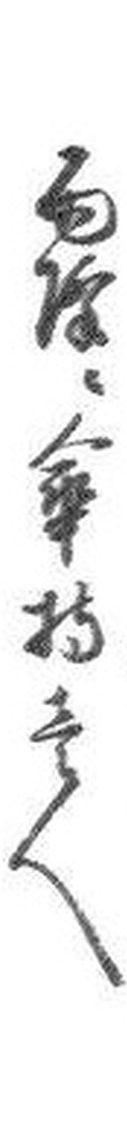雨降ニ傘持壱人
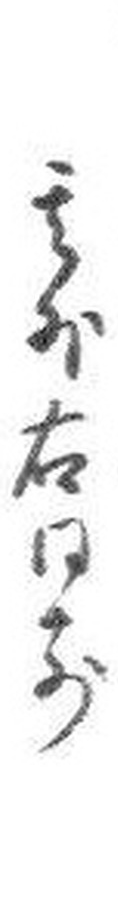其外右同前
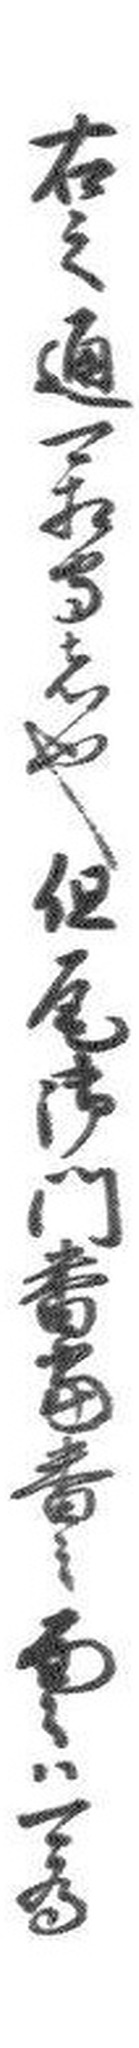右之通可相守者也但瓦御門番当番之面々は可為
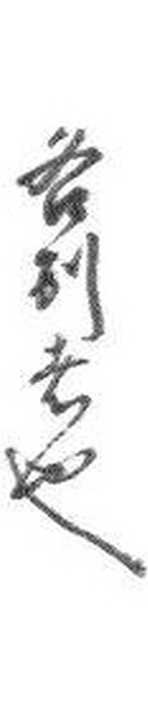各別者也
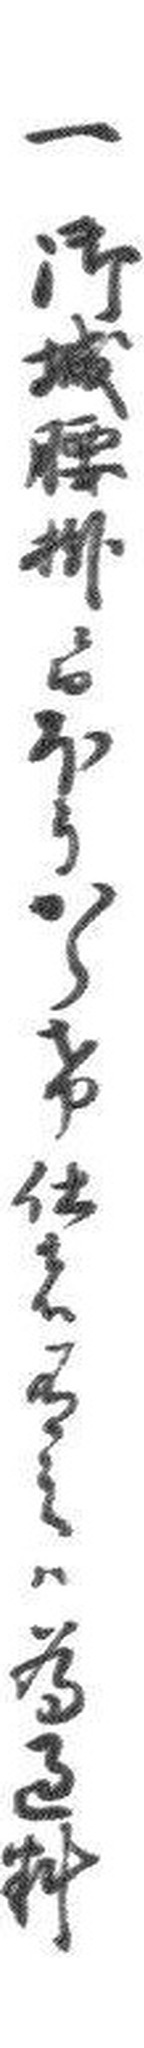一御城腰掛ニ而ほうから希仕者有之は為過料
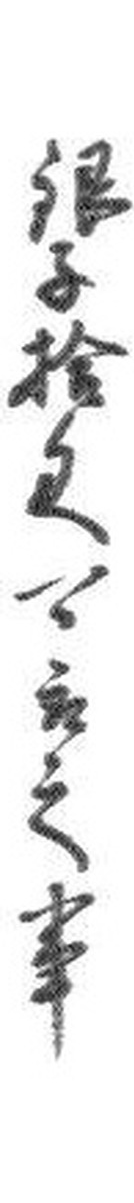銀子拾匁可取之事

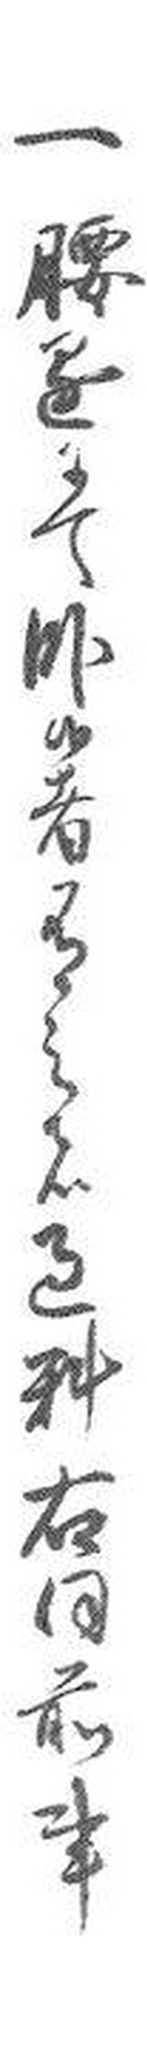一腰懸にて臥候者有之者過料右同前事
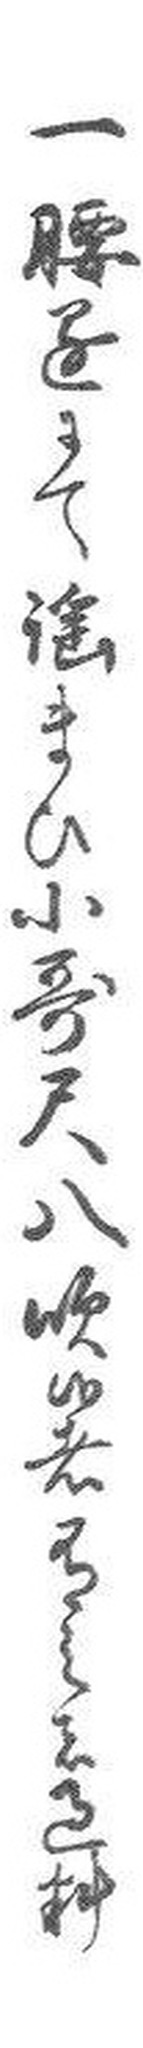一腰懸にて謡まひ小歌尺八吹候者有之者過料
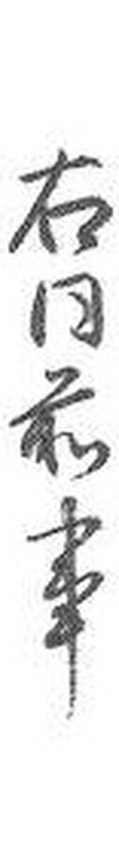右同前事
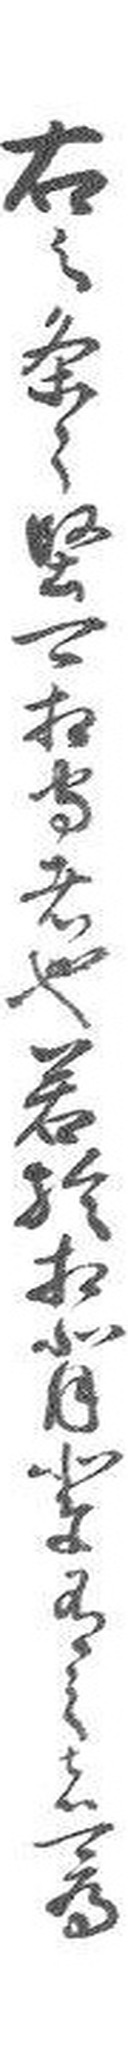右之条々堅可相守者也若於相背輩有之者可為
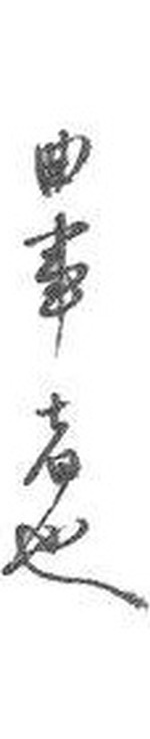曲事者也
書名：家譜 六 光通公 従万治三年到寛文三年
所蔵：福井県文書館 Fukui Prefectural Archives
